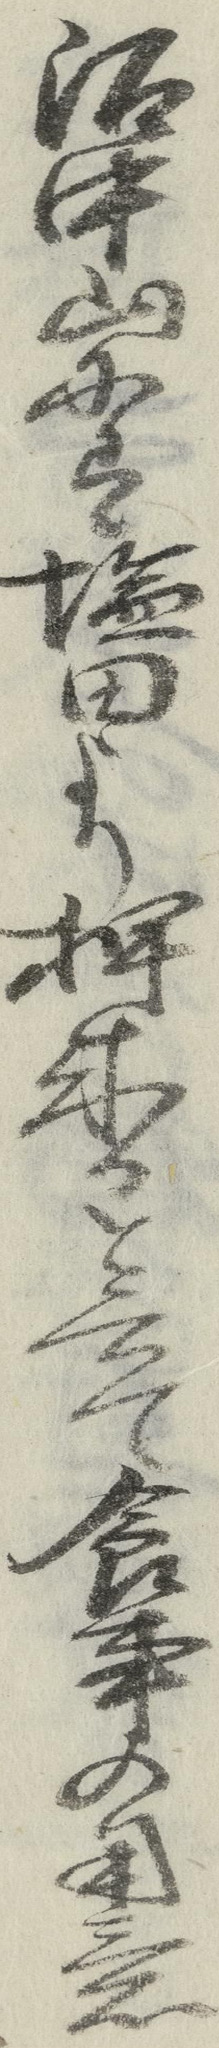沼中山は塩田より押来ると云て食事の用意
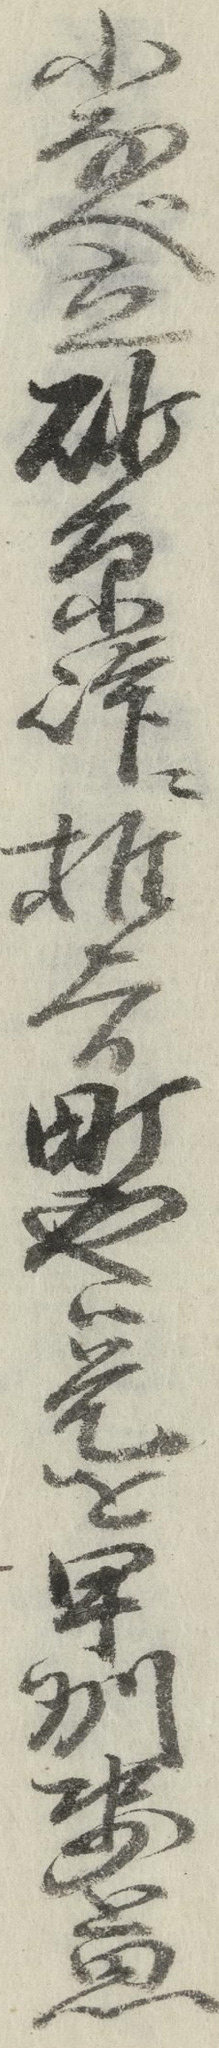小なべ立砂原峠に推上り町やは是を甲州勢と思
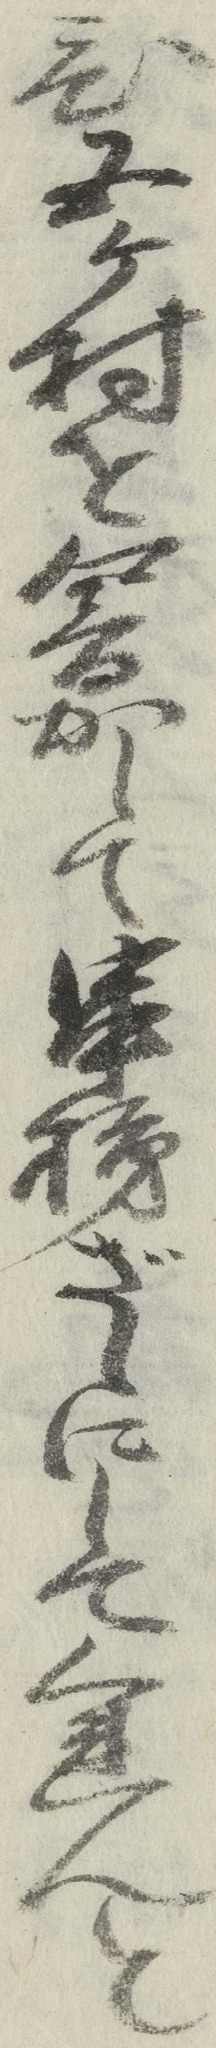ひ五ケ村を響かして串梯ざしにしてくれんと
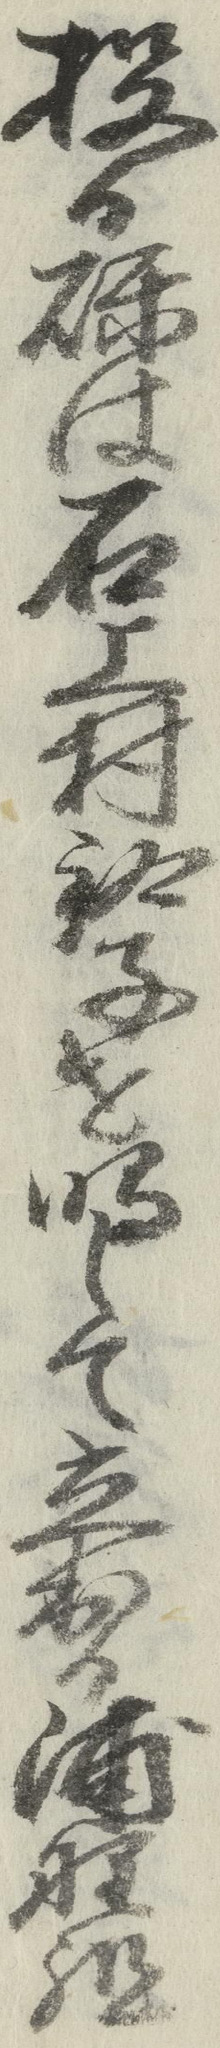投る礫は石上村鈴子を鳴して立出る浦野組
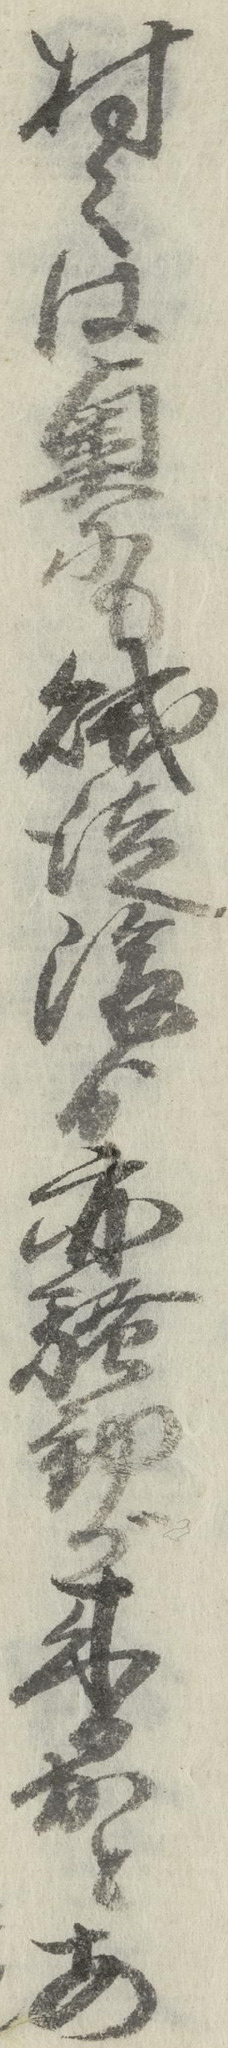村々は奥にも賊徒湲ゟ亦騒動が来るかとあ
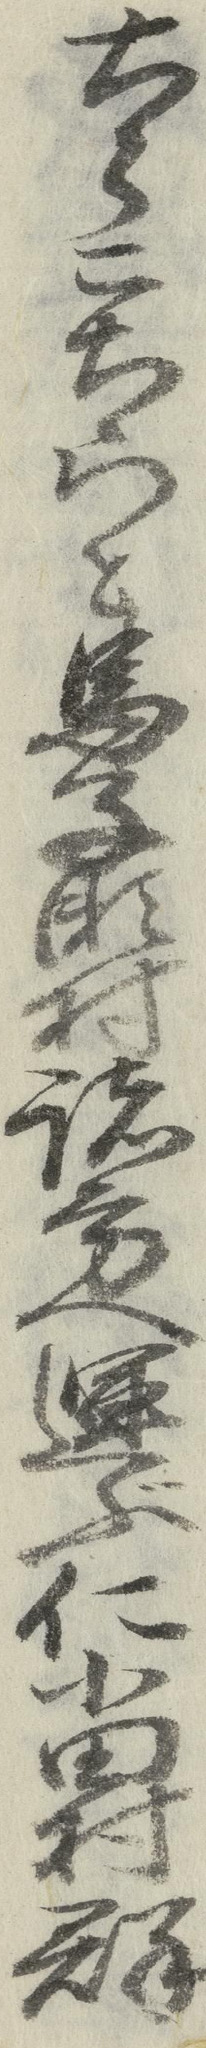ちらこちらと馬子瀬村諸方へ運ぶ仁小田村群

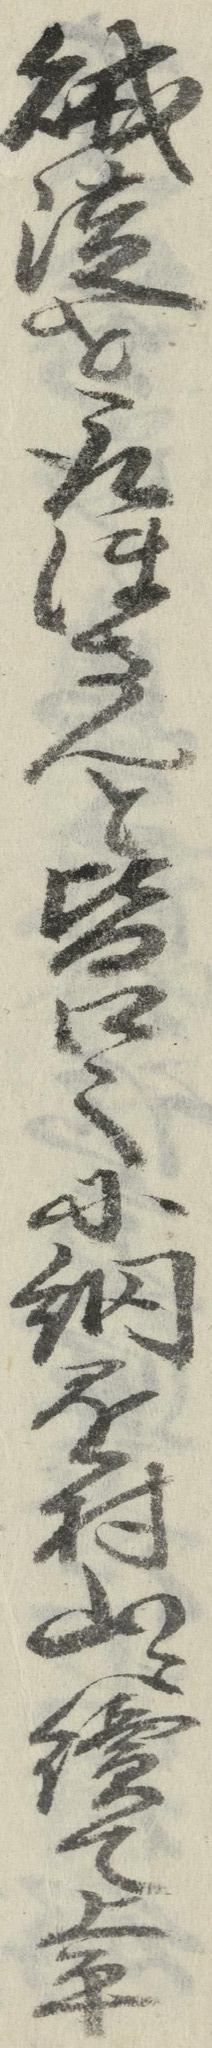賊徒を取ほさんと皆口々に網懸村山に続て上平
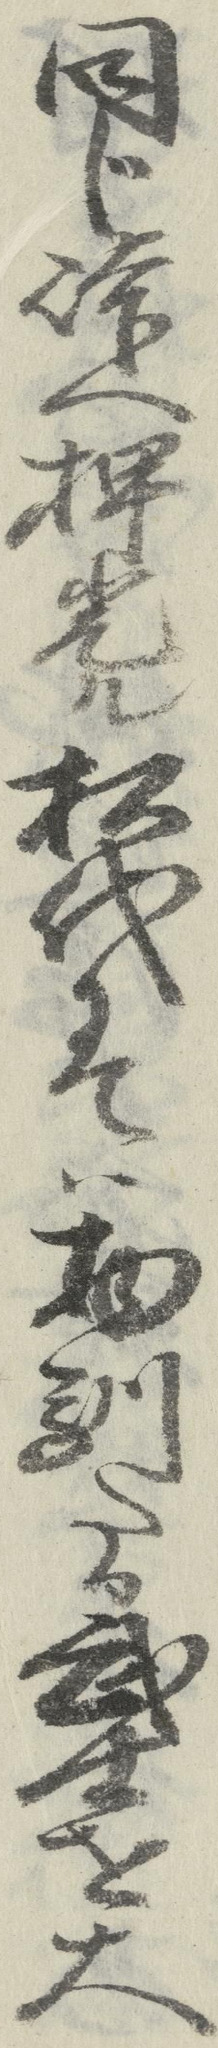同じ峠へ押登ル松代にては物馴たる武士を大
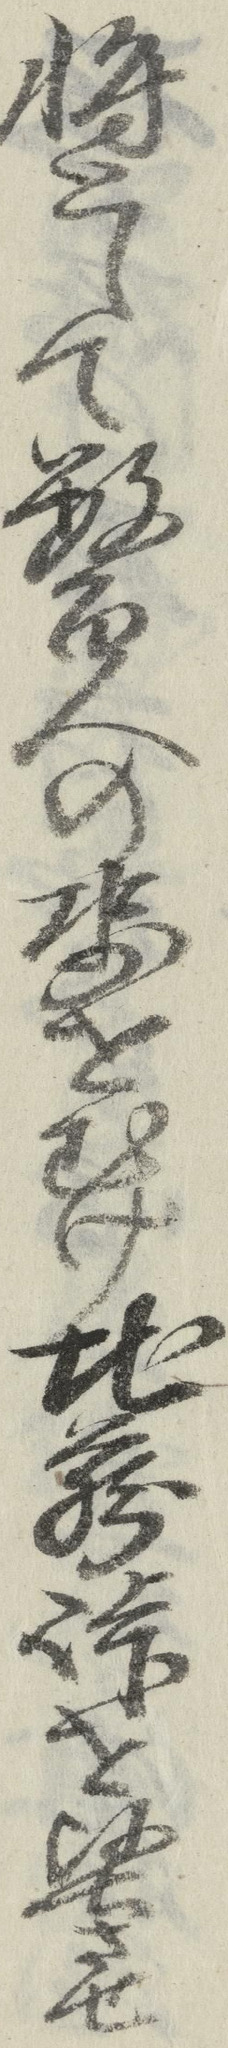将として数百人の勢をむけ地蔵峠を堅させ
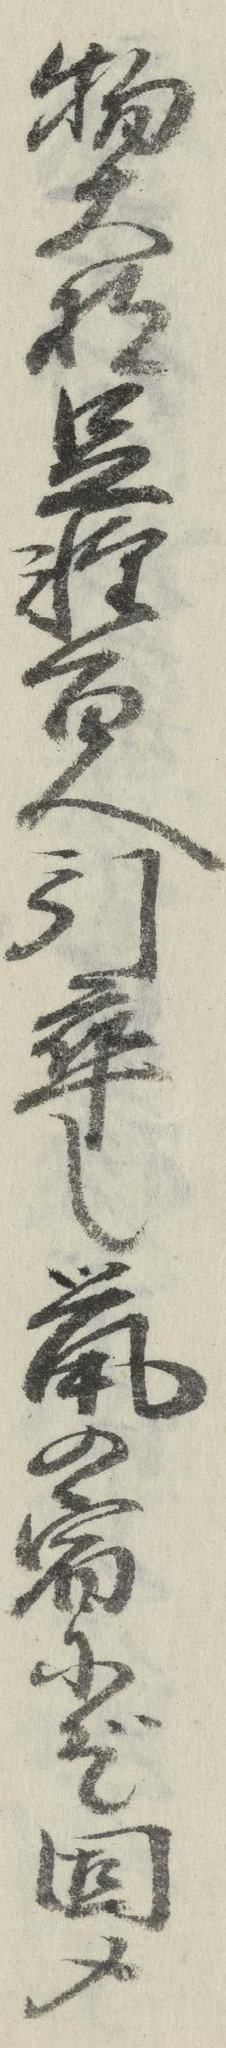物大将足軽百人引率し鼠の宿にぞ固メ
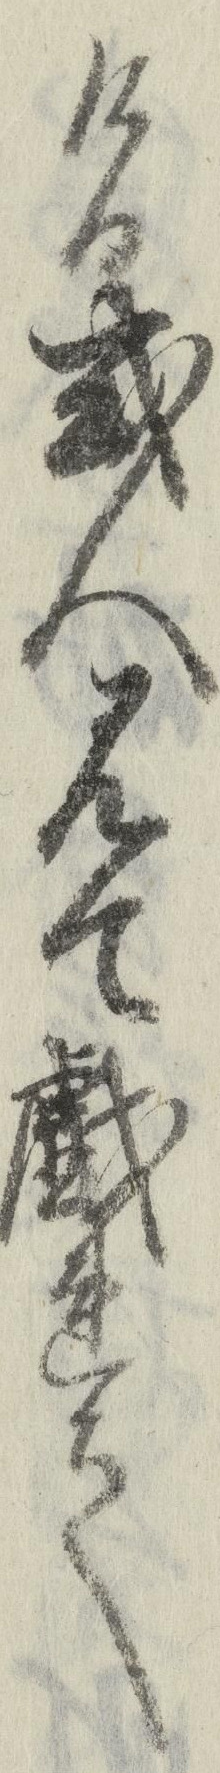ける弐人見て戯れて
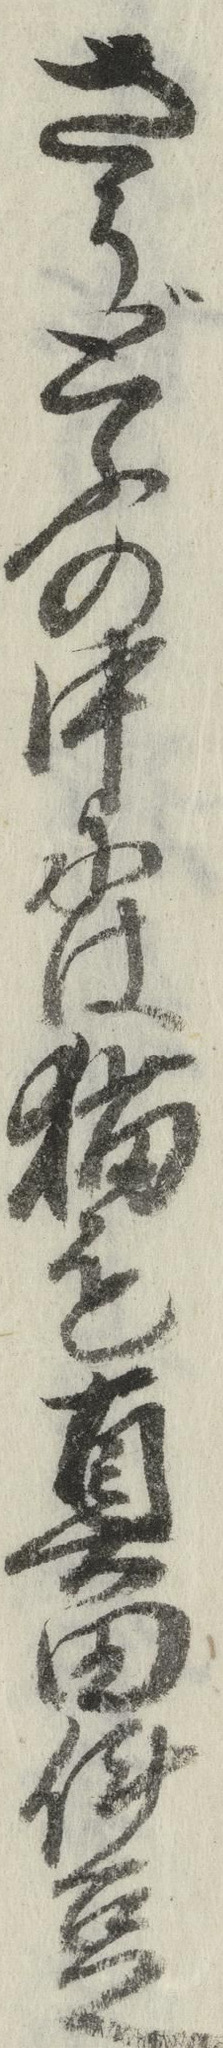さうどふの中には猫を真田伊豆
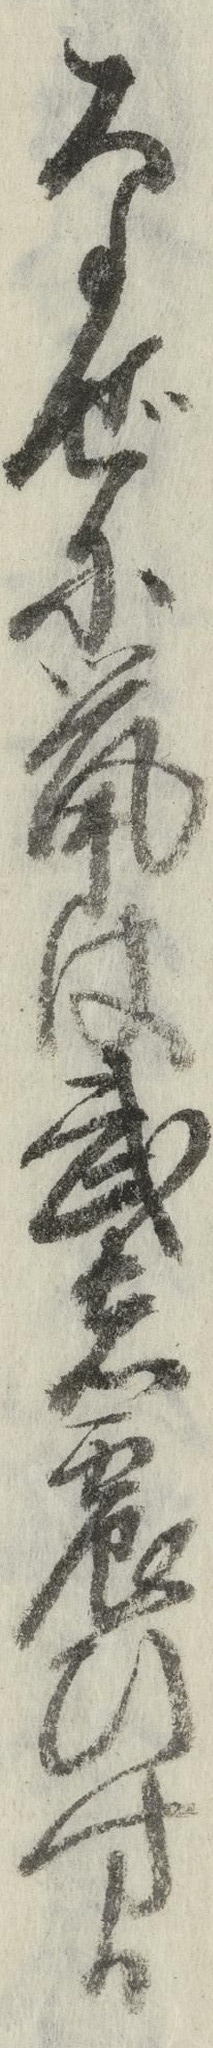なぜに鼠は武者震ひする
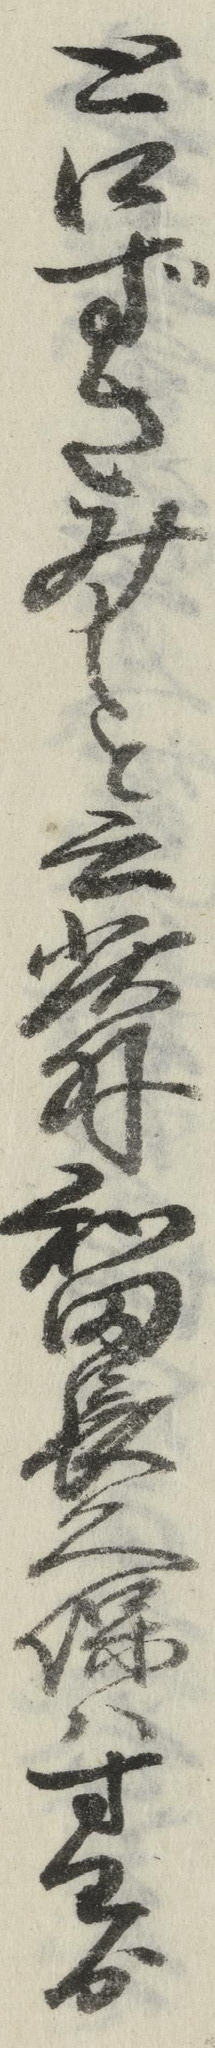と口ずさみしと云此外和田長久保はすわゟ
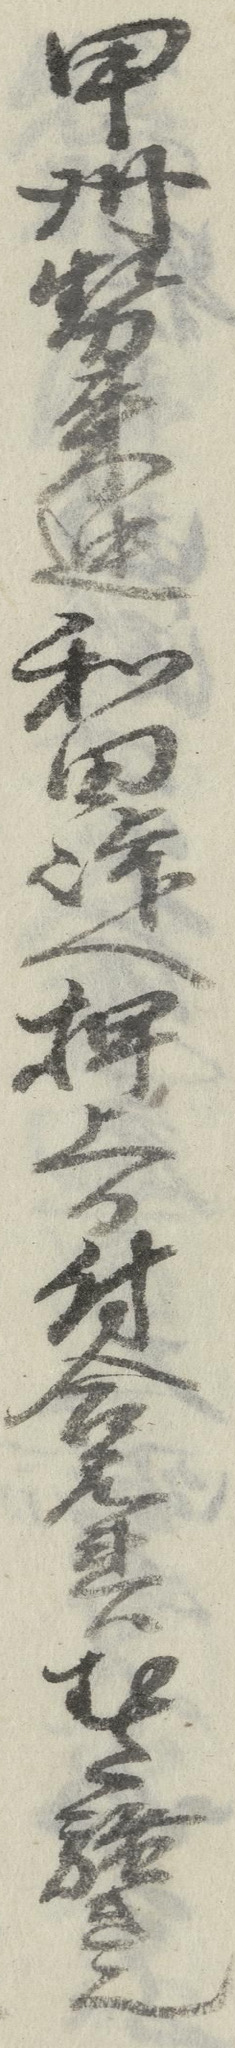甲州勢来迚和田峠へ押上り付合見れはむた騒き也
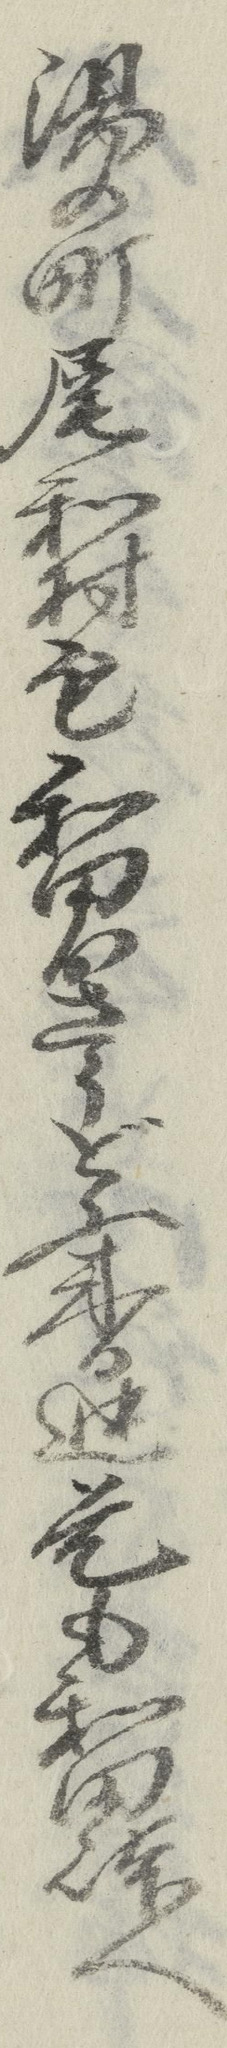湯の町尾和村も和田ゟさうどふ来る迚是も和田峠へ
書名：浅間大焼騒動記　下
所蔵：東京大学地震研究所図書室 Earthquake Research Institute Library, The University of Tokyo, JAPAN
